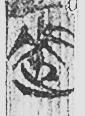麥
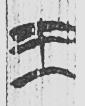王
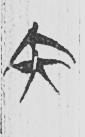內
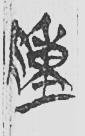陳
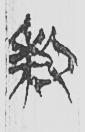殺
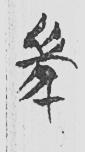{山一王}
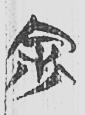余
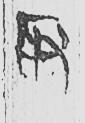取
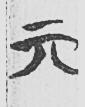亓
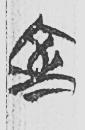室
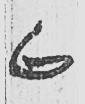㠯（以）
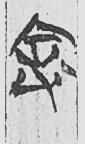{余又}
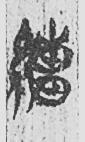{糸東田}
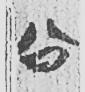公
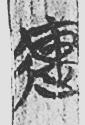連
